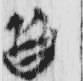皆
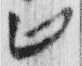㠯（以）
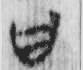甘
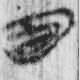固
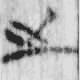之
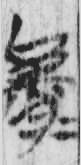○（爨）
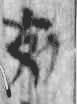死
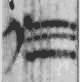於
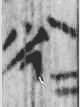小人
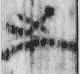之
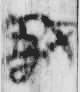敔
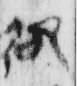卲
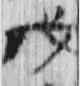戊
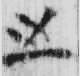之
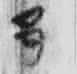邑
